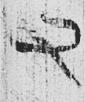又（有）
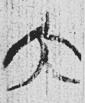大
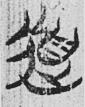道
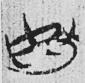{女匕}（焉）
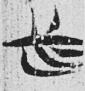必
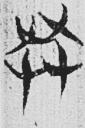共（恭）
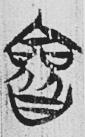○（儉）
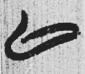㠯
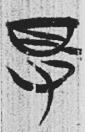○（得）
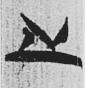之
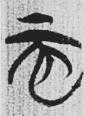而
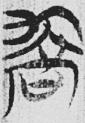喬（驕）
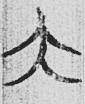大（泰）
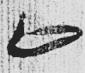㠯
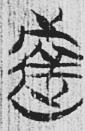○（失）
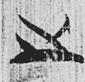之
